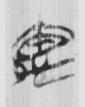寓
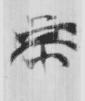不
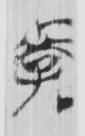李
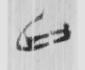㠯（以）
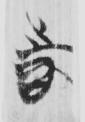𠱾
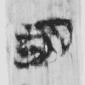明
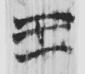王
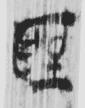聖
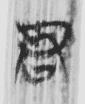君
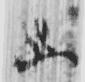之
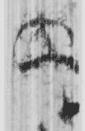立
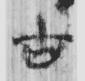古
